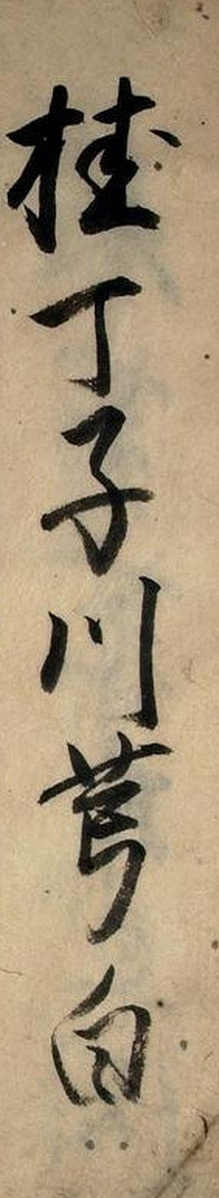桂丁子川芎白
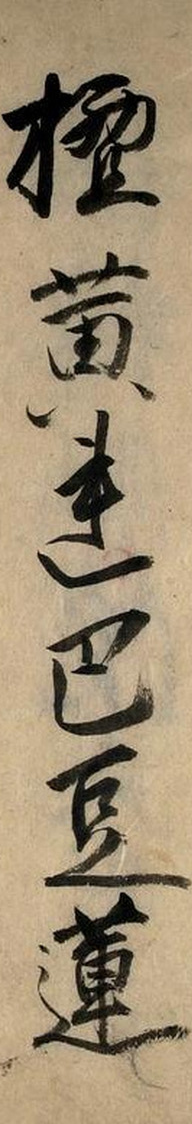檀黄連巴豆蓮
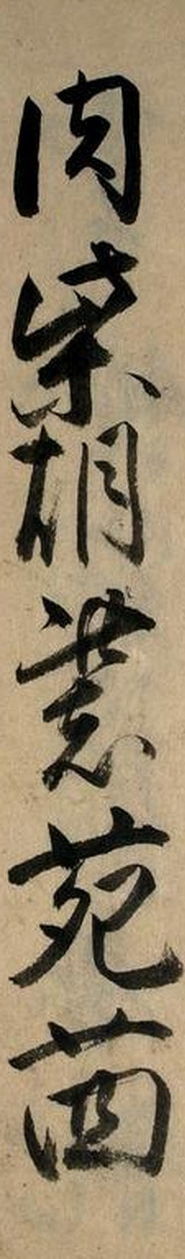肉柴胡紫苑茴
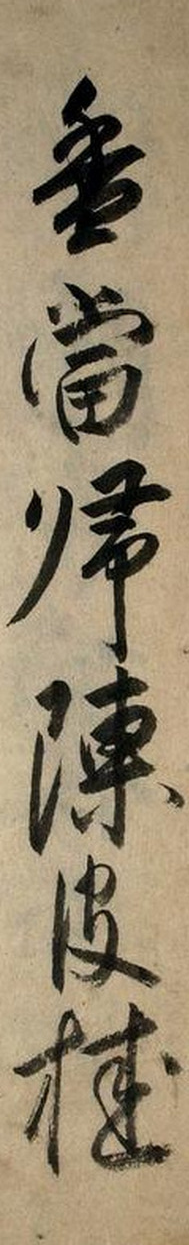香当帰陳皮桂
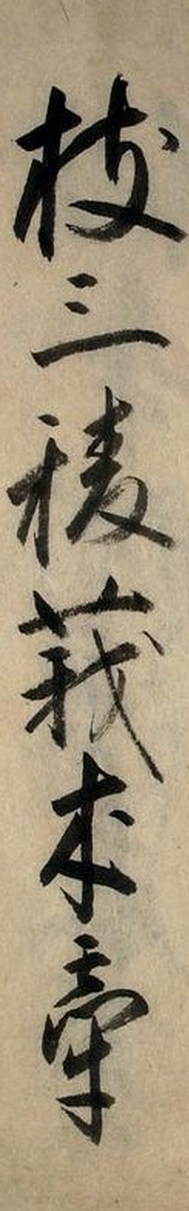枝三稜莪朮牽
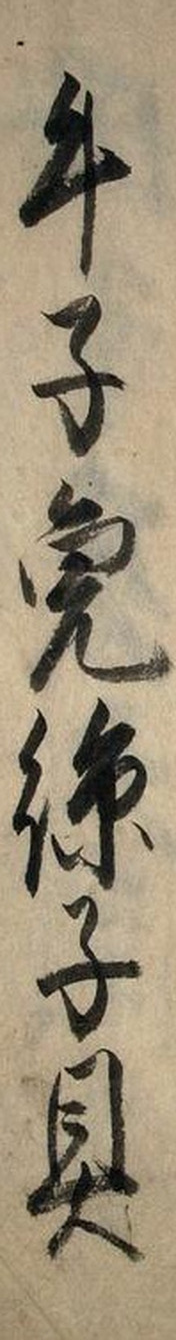牛子兎絲子具

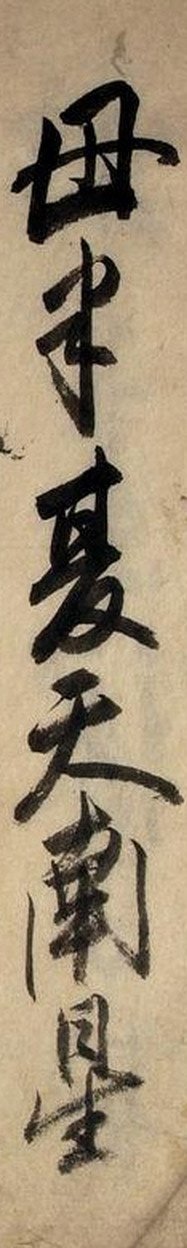母半夏天南星
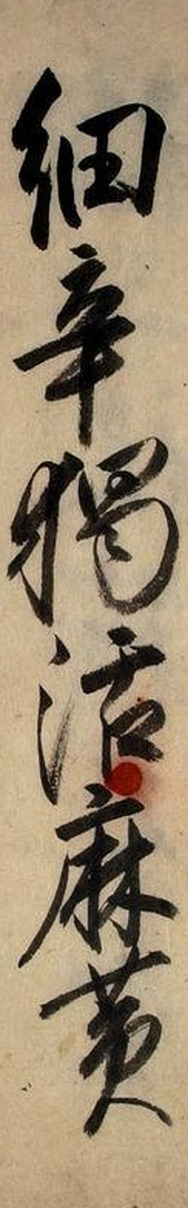細辛独活麻黄
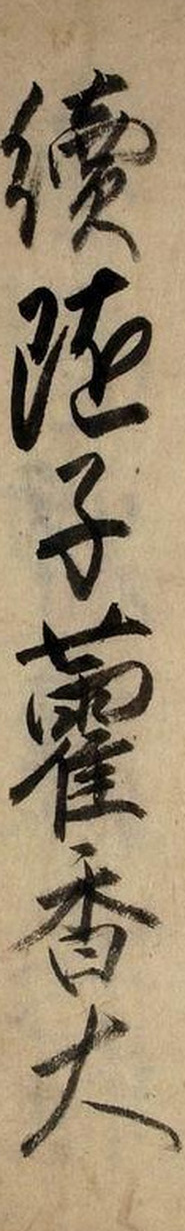続随子藿香大
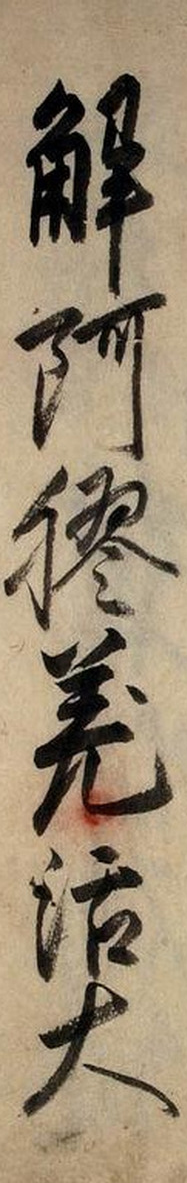解阿膠羌活大
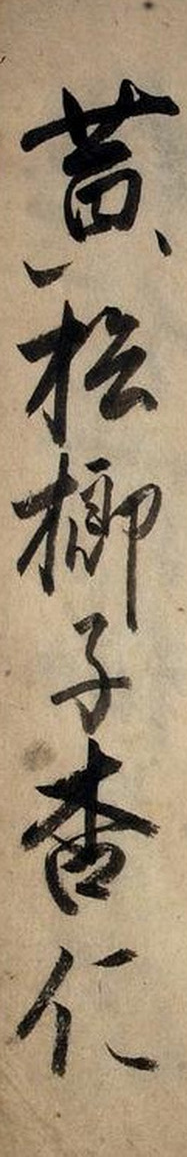黄梹榔子杏仁

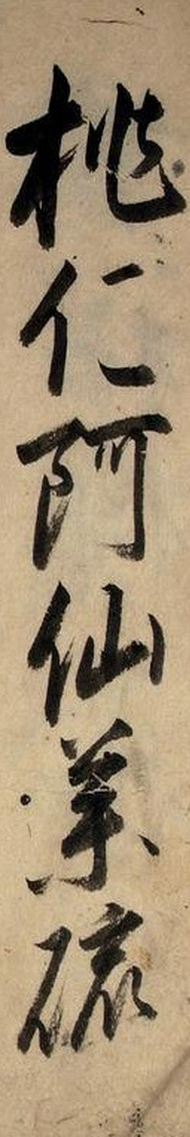桃仁阿仙薬硫
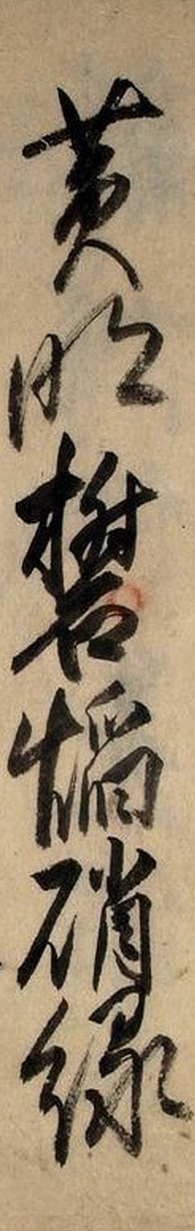黄明礬焰硝緑
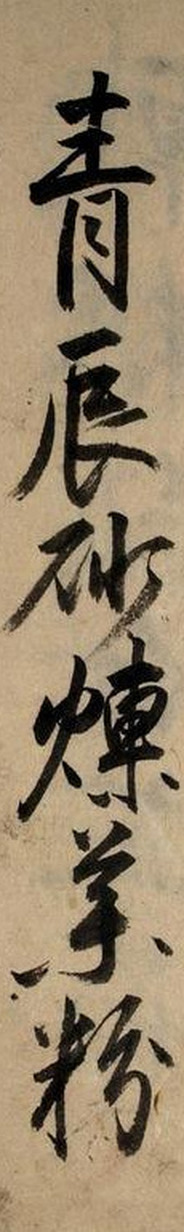青辰砂練薬粉
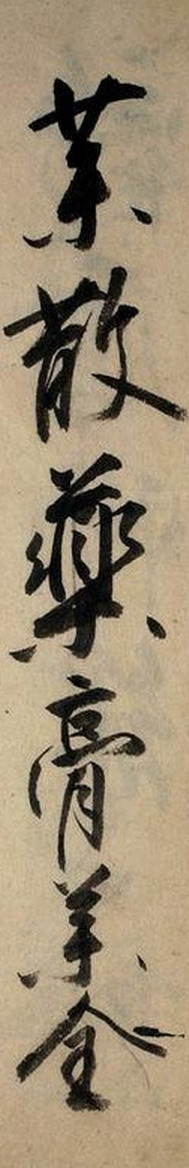薬散薬膏薬全
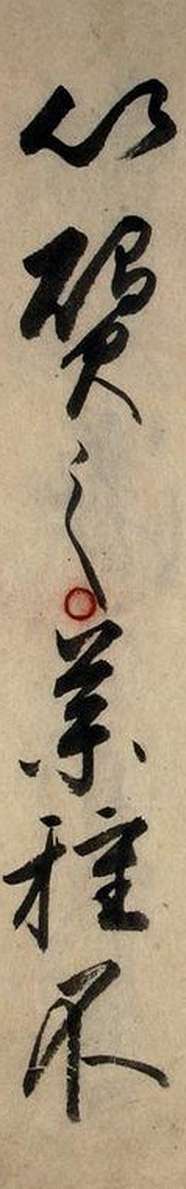以贋之薬種不
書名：商売往来（往来物、手習手本）
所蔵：福井県文書館 Fukui Prefectural Archives
